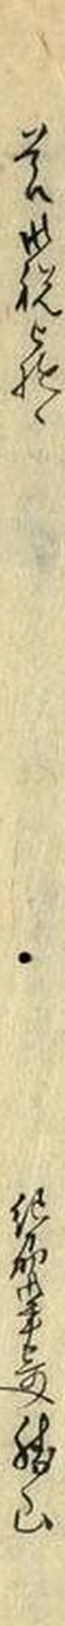節御祝被遊候
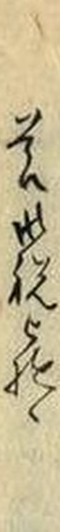節御祝被遊候
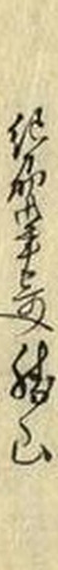紀州御年寄勝山
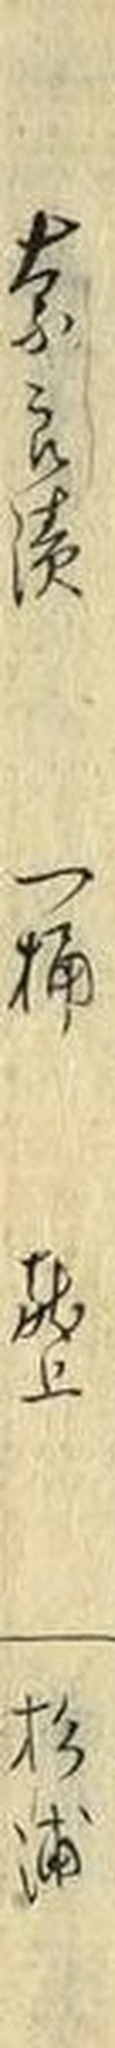奈良漬一桶献上杉浦
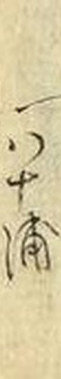八十浦
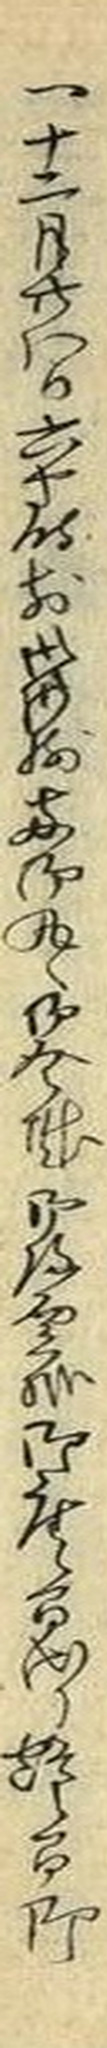一十二月廿八日六半時前御供揃両御丸へ御登城御帰殿掛御座之間代り鶴之間御
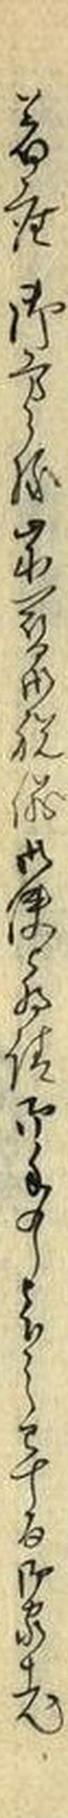着座御方々様歳暮御祝儀御使被為請御手のし被下之畢而御家老
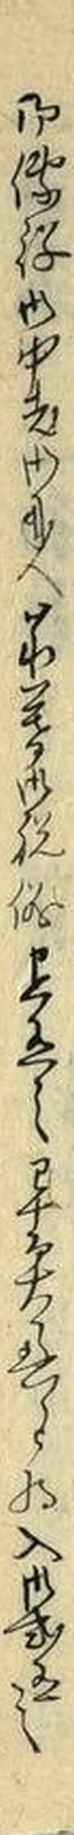御傅役御中老御用人歳暮御祝儀申上之畢而大奥被為入御式有之
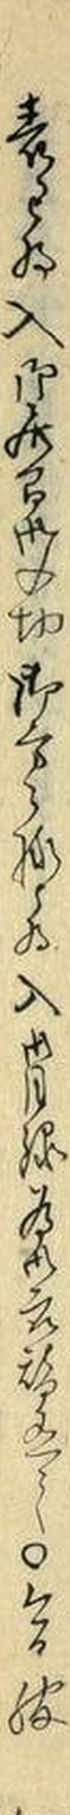表へ被為入御居間御〆切御方々様被為入御目録為御取替有之○今日服
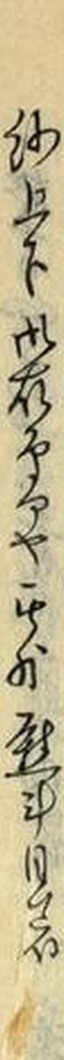紗上下御右筆部や其外熨斗目着
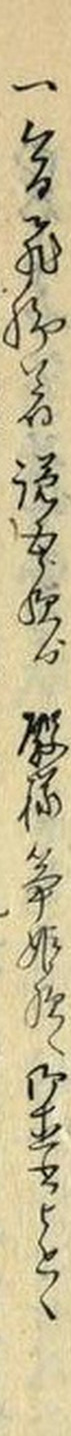一今日飛脚着謙五郎様ゟ殿様箏姫様へ御直書被進候
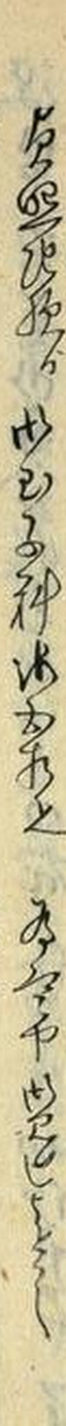貞照院様ゟ御玉子料銀五拾疋為寒中御見廻被進之
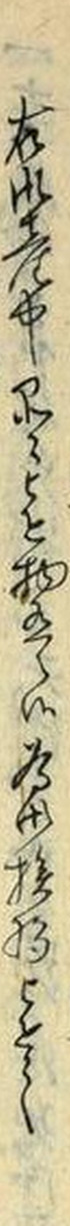右御産中品々被進物有之候為御挨拶被進之
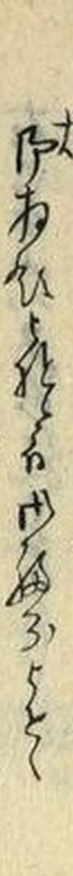右御拝領被遊候ニ付御福分被進之
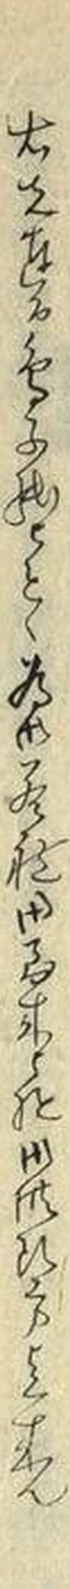右先達而鳥子紙被進候為御答礼御到来被遊御供頭方迄来ル
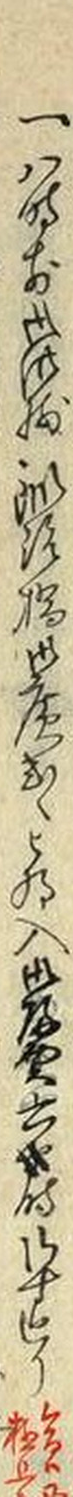一八時前御供揃鍛治橋御広式へ被為入御帰殿六時弐寸廻り
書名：少傅日録抄（斉承付側向頭取日記、在府）
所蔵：福井県文書館 Fukui Prefectural Archives
